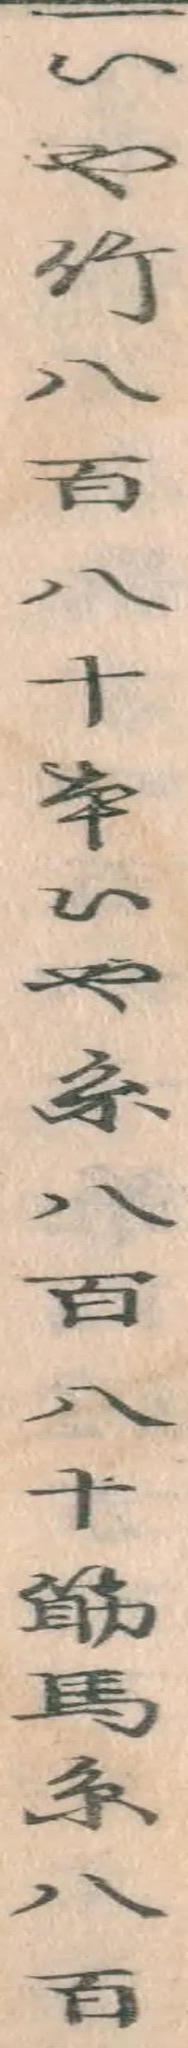一いや竹八百八十本いや糸八百八十筋馬糸八百

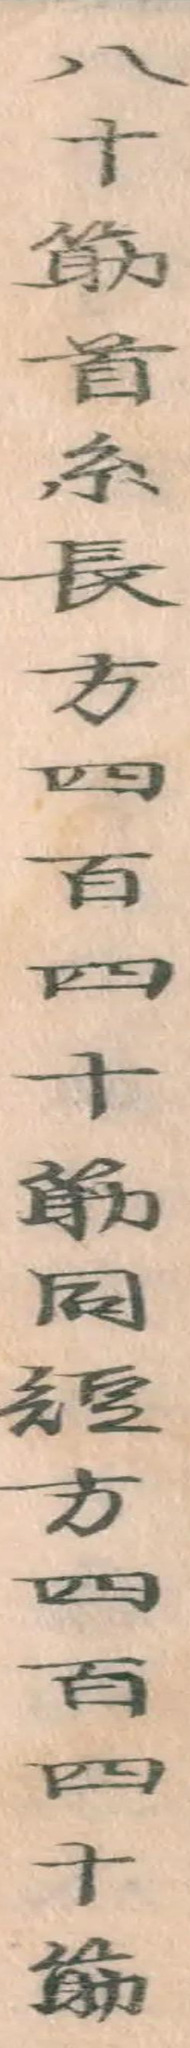八十筋首糸長方四百四十筋同短方四百四十筋
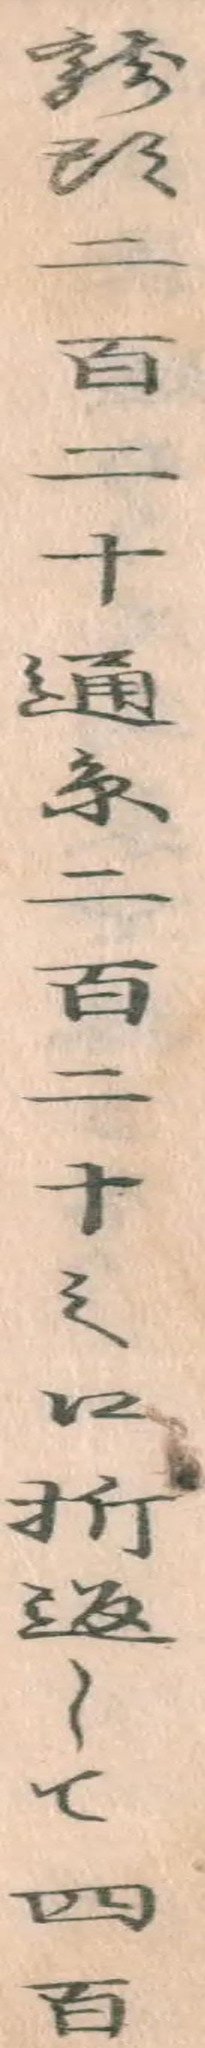竜頭二百二十通糸二百二十之口折返して四百
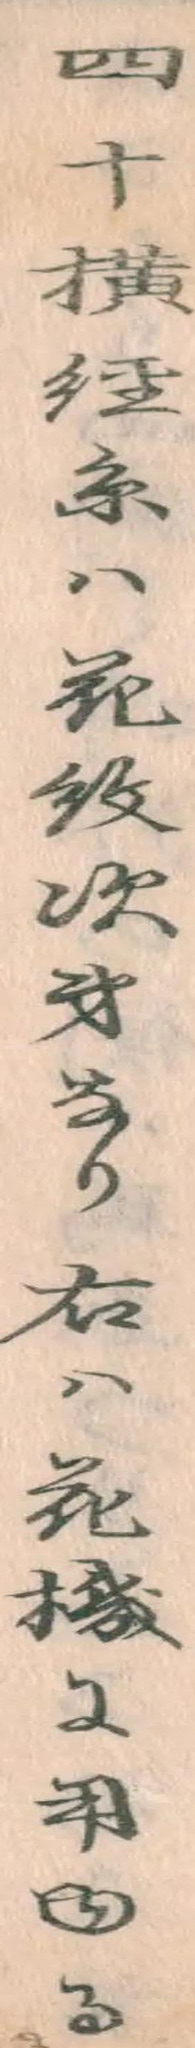四十横経糸は花紋次第なり右は花機に用ゆる
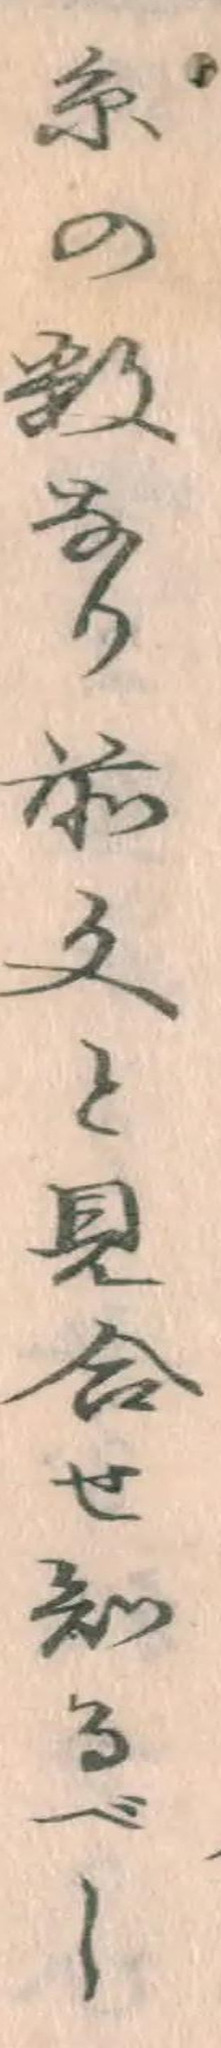糸の数なり前文と見合せ知るべし
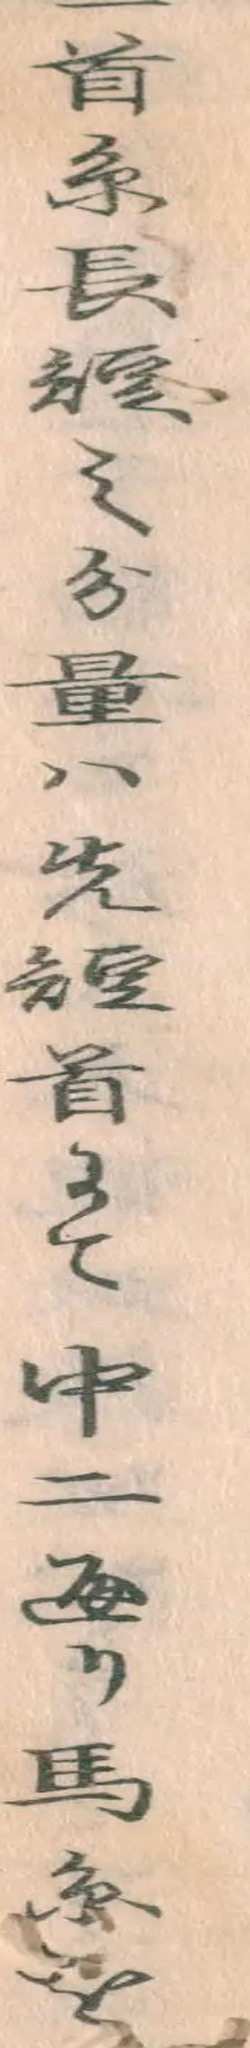一首糸長短之分量は先短首にて中二通り馬糸を
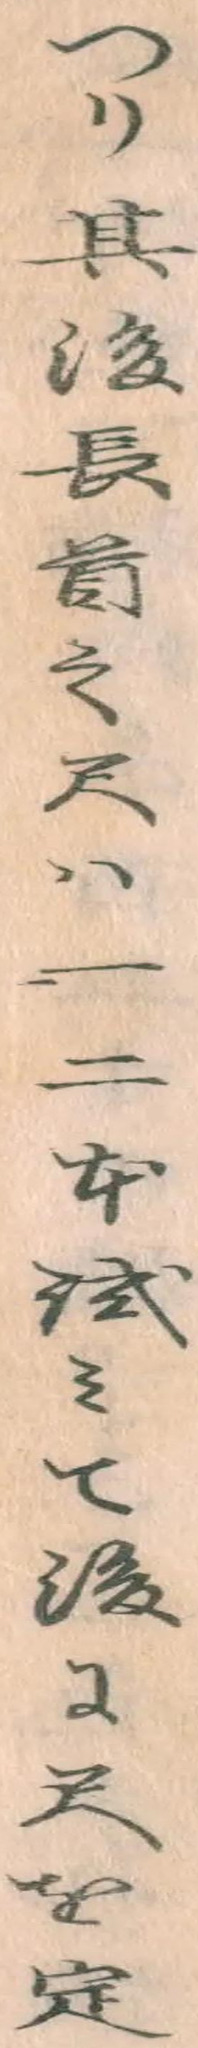つり其後長首之尺は一二本試みて後に尺を定
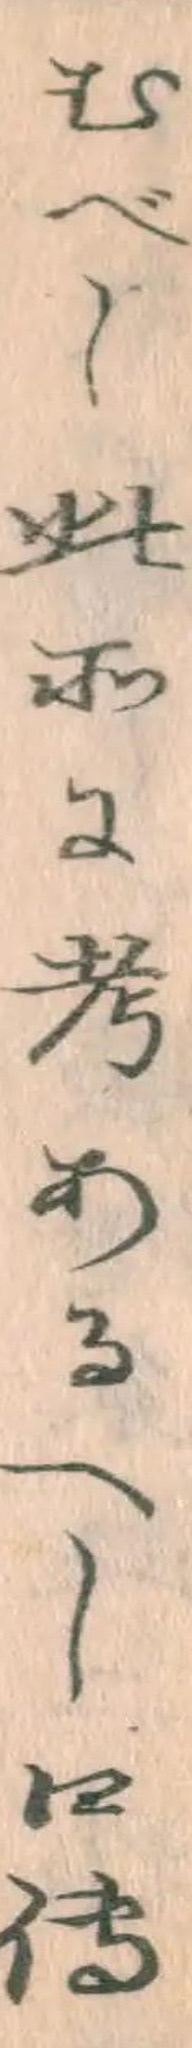むべし此所に考あるへし口伝
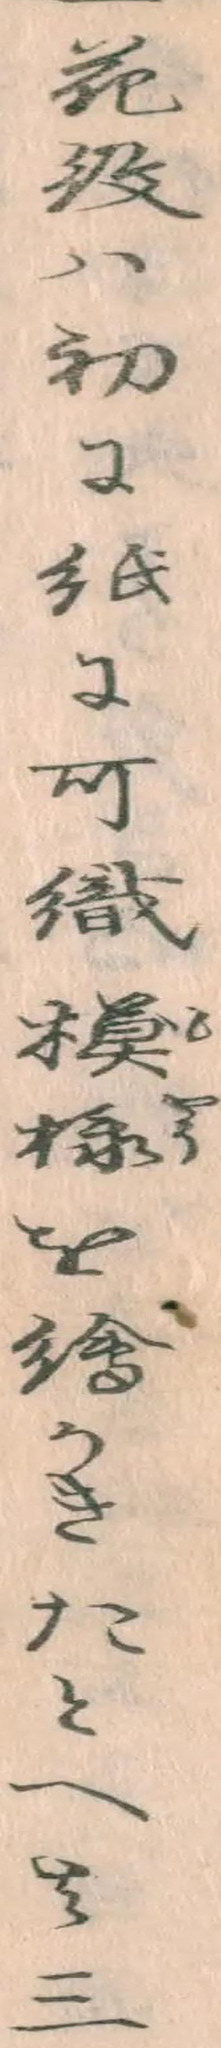一花紋は初に紙に可織模様を絵かきたとへは三
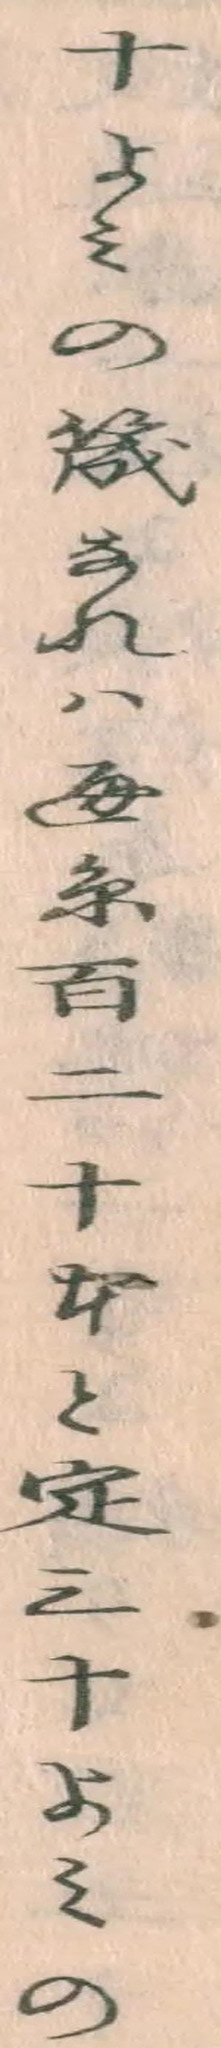十よみの筬なれは通糸百二十本と定三十よみの
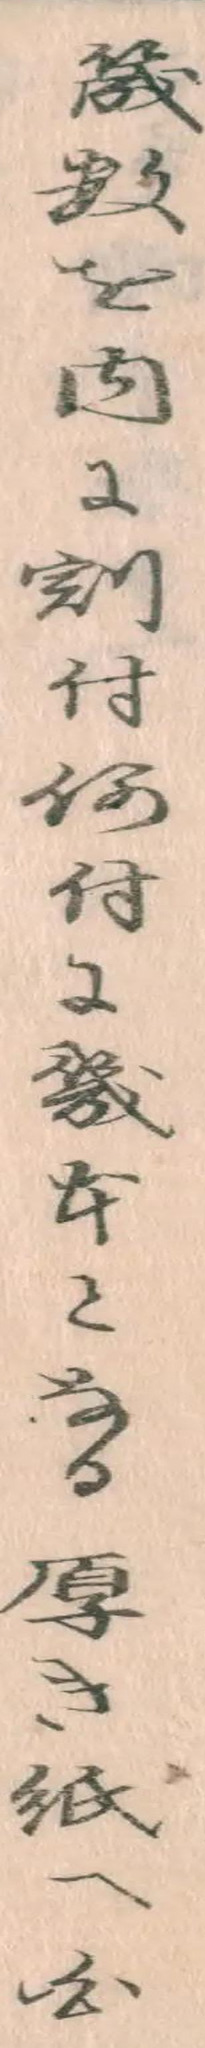筬数を内に割付何付に幾本となる厚き紙へ白
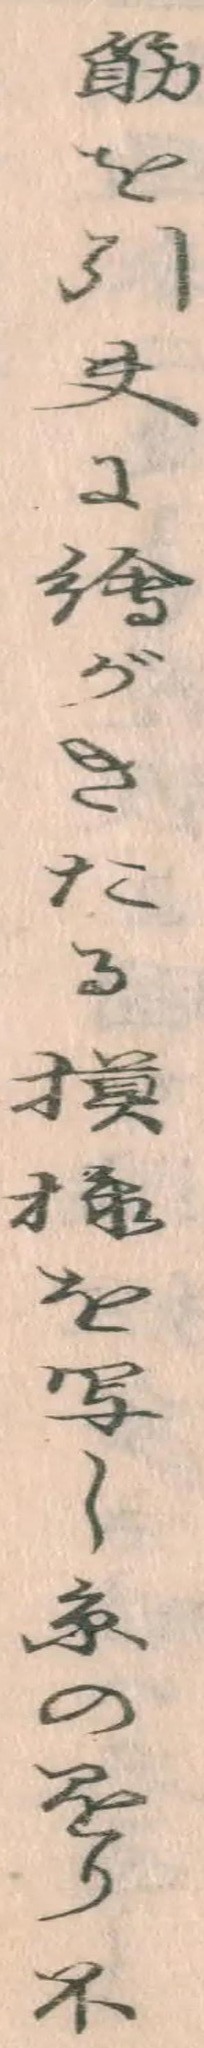筋を引夫に絵がきたる模様を写し糸の懸り不
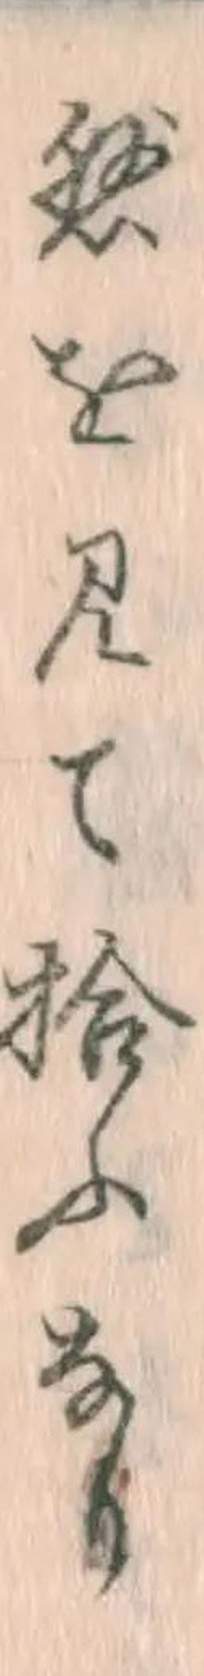懸を見て拾ふなり
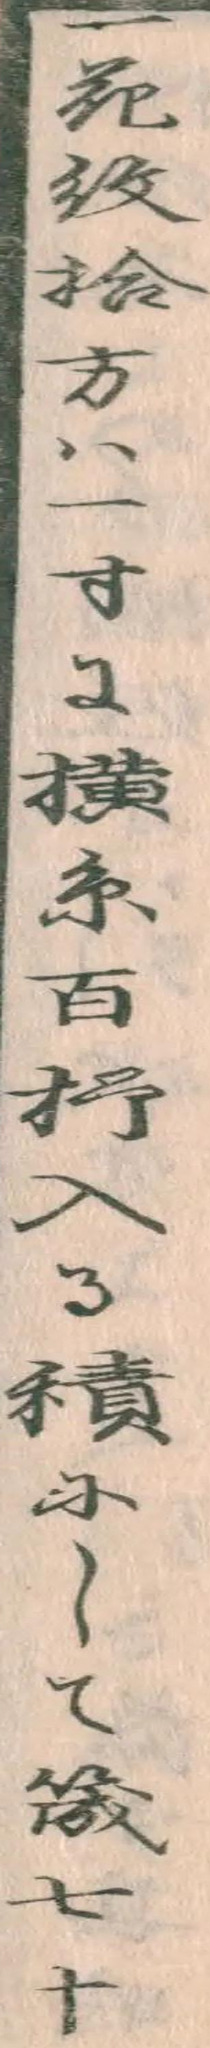一花紋拾方は一寸に横糸百杼入る積にして筬七十
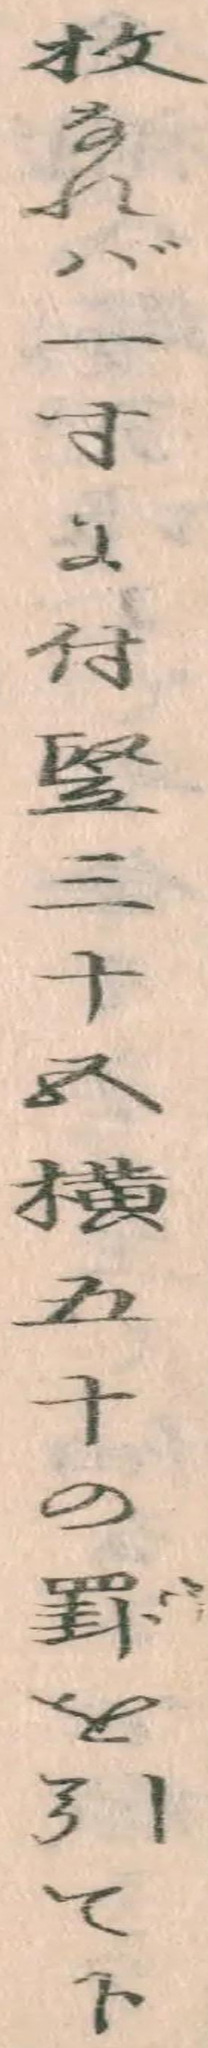枚なれば一寸に付竪三十五横五十の罫を引て下
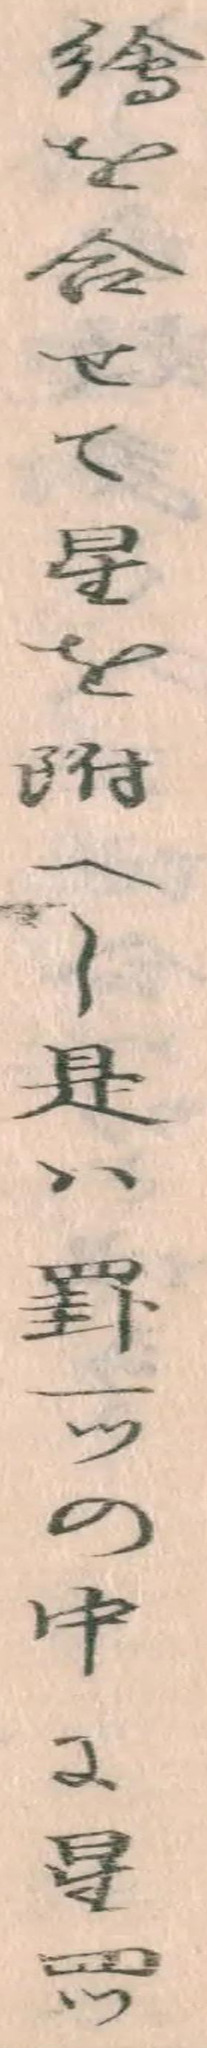絵を合せて星を附へし是は罫一ッの中に星四ッ
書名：機織彙編 5巻. [2]
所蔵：国立国会図書館 National Diet Library, JAPAN
